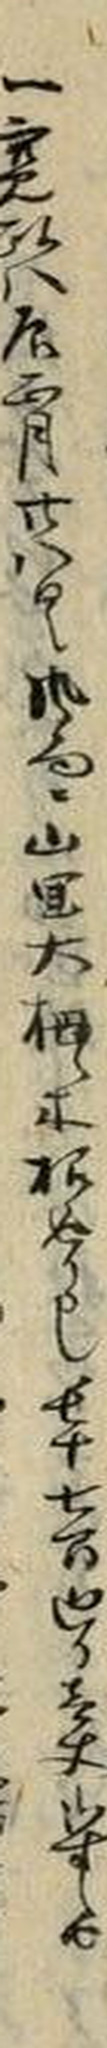一寛政八辰正月廿八日之風雨に山里大栂之木根返り申候長十七間廻り壱丈弐寸之由
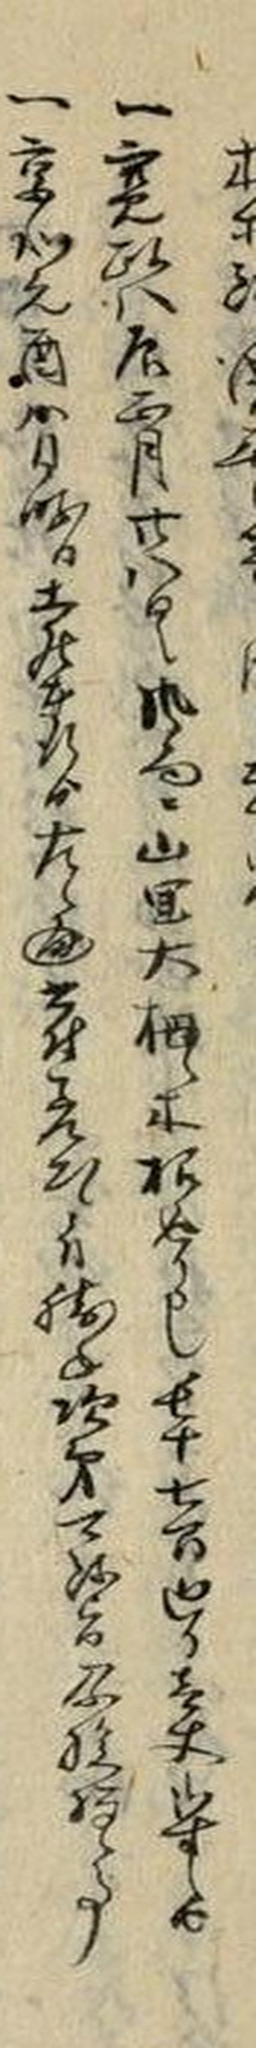一享和元酉八月晦日土居奉行ゟ左之通書付差出候に付勝手次第可致旨及挨拶候事
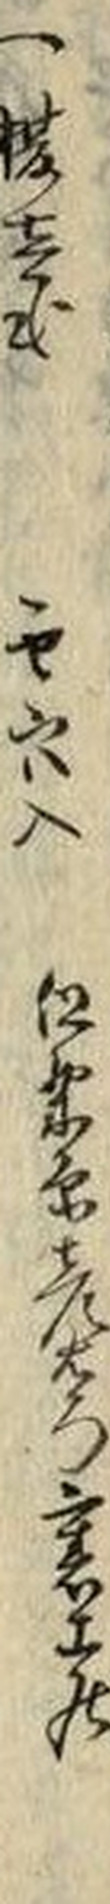一榎壱本空穴入但栗原彦右衛門裏土居
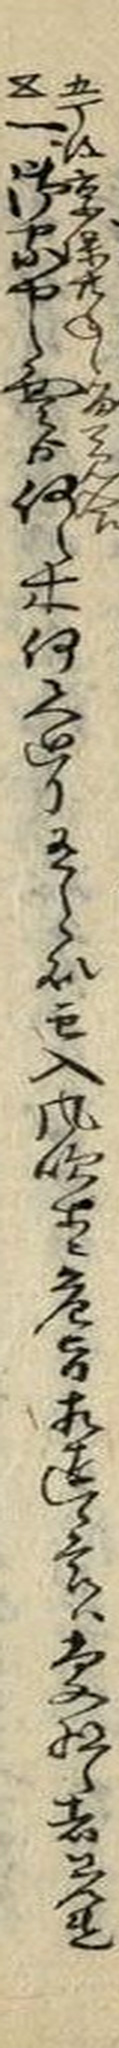一御家中之面々ゟ何之木何尺廻り有之候処空入風吹等に危旨相達候節は尚又組之者差遣
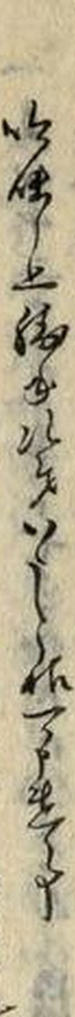吟味之上勝手次第いたし候様可申遣事
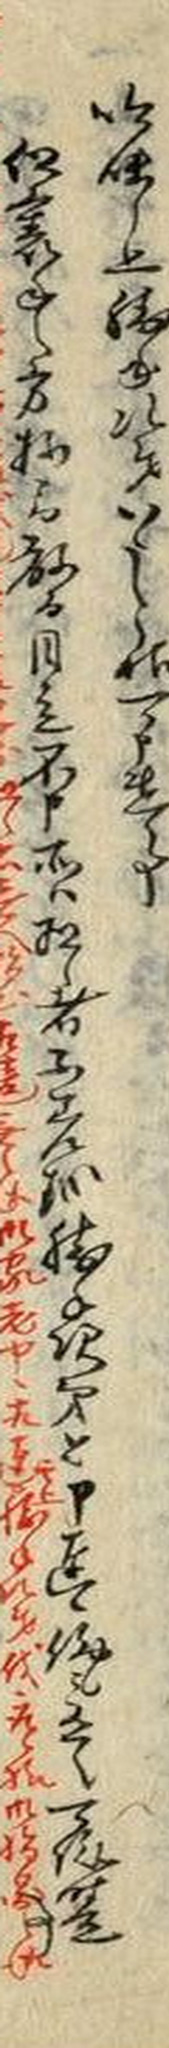但裏手之方抔にて敢て目立不申所は組之者不差越勝手次第と申達候儀も有之可依時宜事
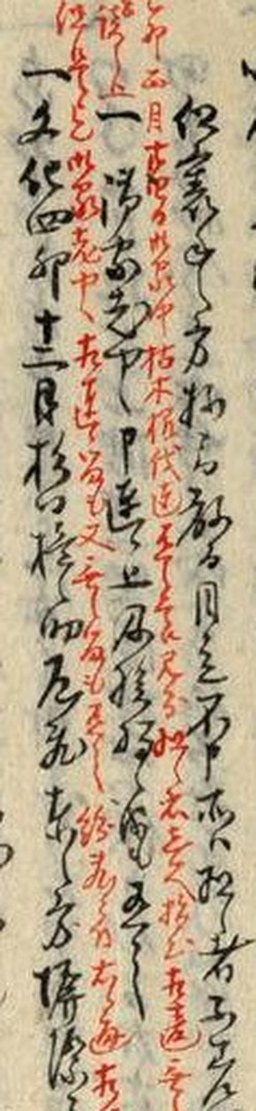一御家老中へ申達候上及挨拶候儀も有之
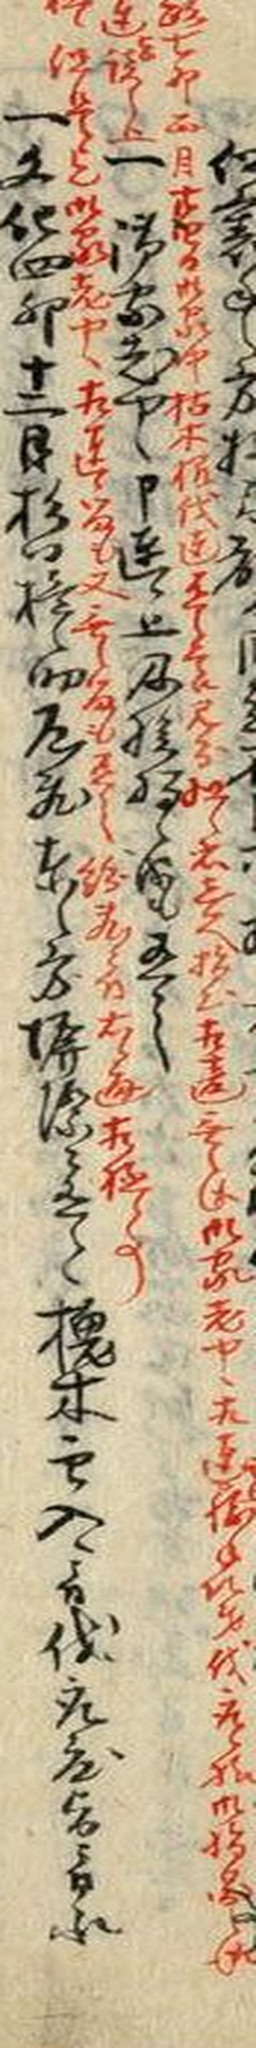一文化四卯十二月杉田権之助屋敷東之方塀際に有之槐木空入候に付伐取度旨に付承
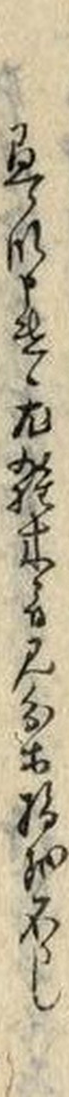置候段申遣候尤雑木に付見分等指越不申候
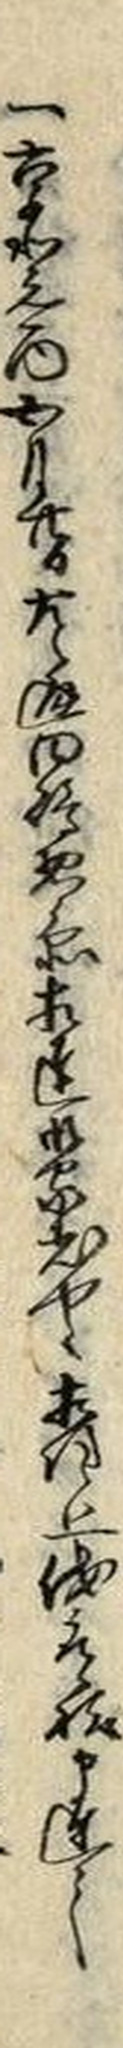一享和元酉五月廿日左之通田島惣兵衛相達御家老中へ相伺候上伐取候様申達之
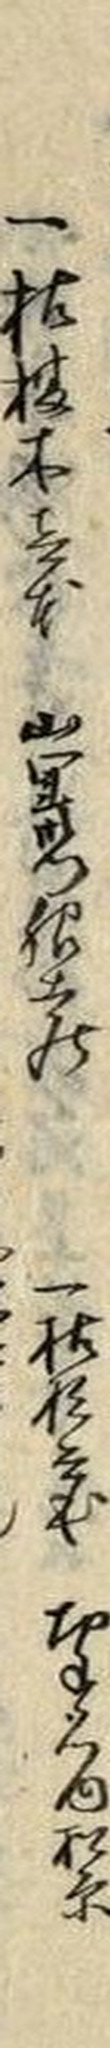一枯榎木壱本山里御門脇土居一枯杉壱本切手御門内松原
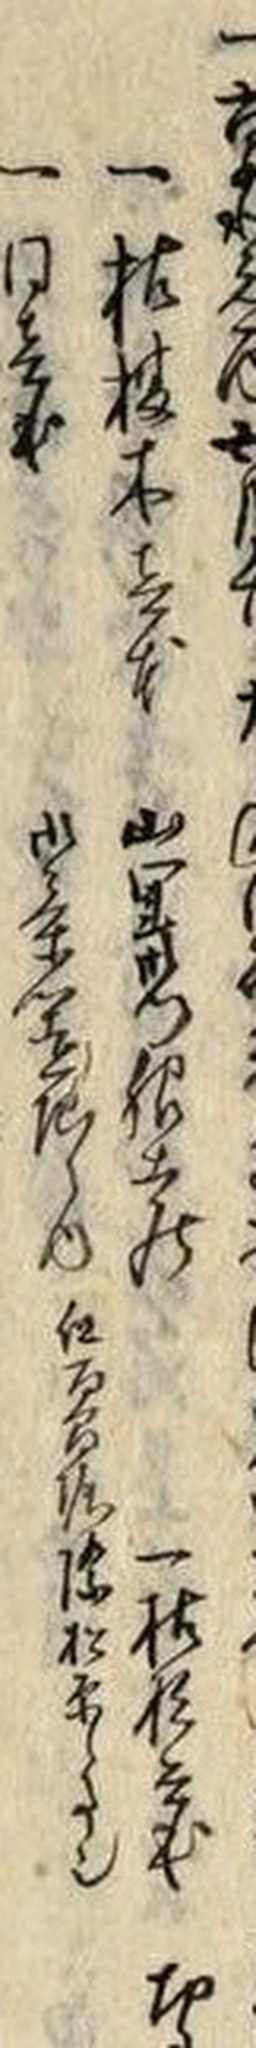一同壱本御茶園地之内但百閒堀際松原之事也

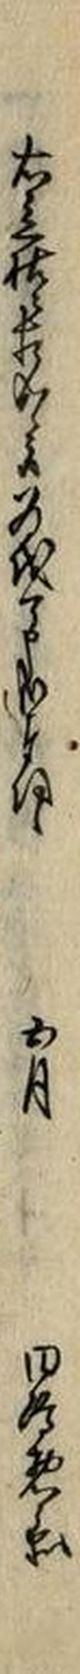右立枯に相成候には為伐可申哉奉伺候五月田島惣兵衛
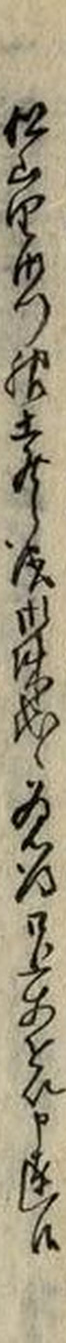但山里御門脇土居之儀御城代へ為心得口上使を以申達候
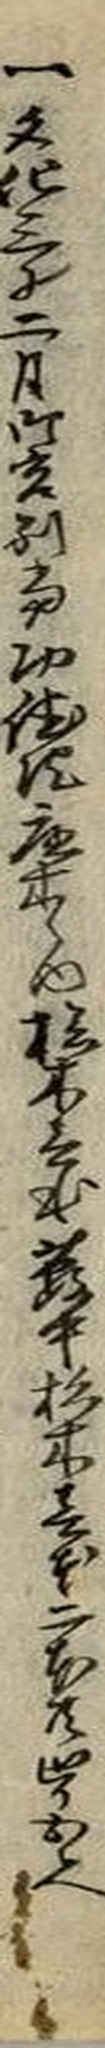一文化三刁二月御宮別当功徳院庭木之内桧木壱本薮中杉木壱本二本共廻り五尺
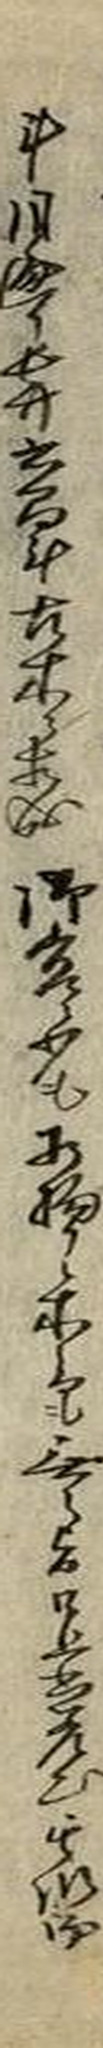斗目通り長サ六間斗古木に相成御宮に少も相拘り候木に而も無之旨口上書差出其段御
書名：御城下諸事之部
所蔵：福井県文書館 Fukui Prefectural Archives
